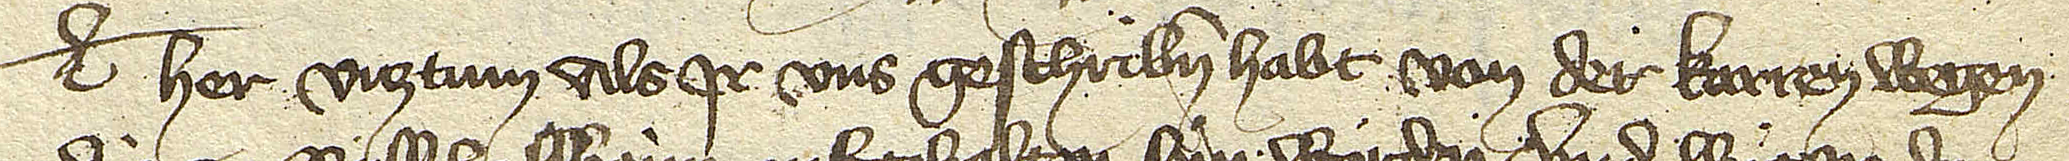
L* her vicʒtum Als Ir vns geſchribn* habt von der karren wegen
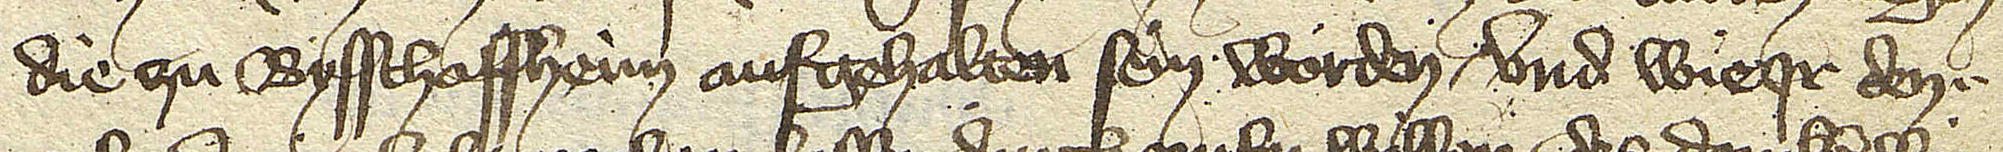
die cʒu Byſſchofſheim aufgehalten ſein worden / vnd wie Ir den ~
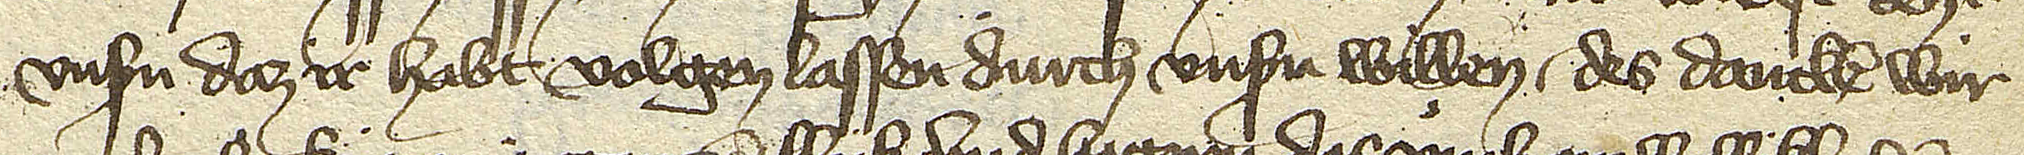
vnſ*n daʒ ir habt volgen laſſen durch vnſ*n willen / des dancke* wir
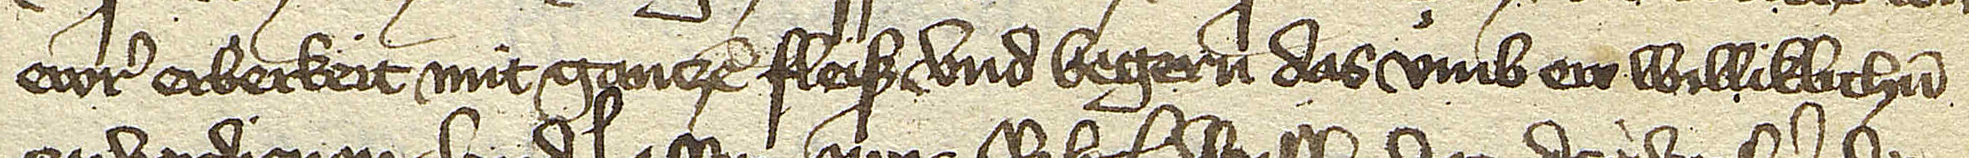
ewr* erberkeit mit gancʒe* fleiſʒ / vns begern das v̈mb ew williklichn*
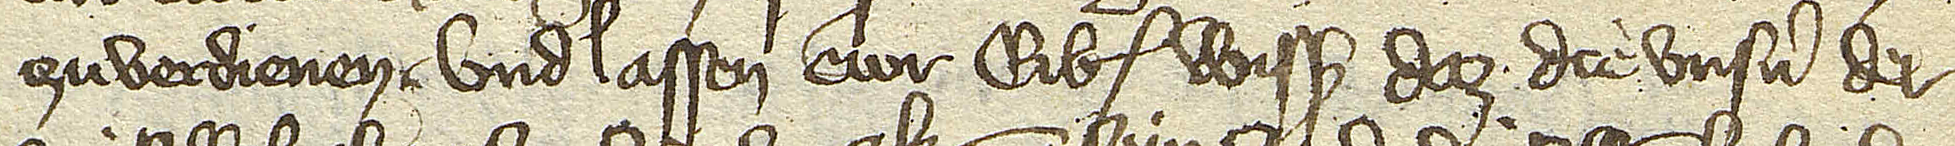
cʒu verdienen / vnd laſſen ewr Erb* wiſſ* daʒ die vnſn* der
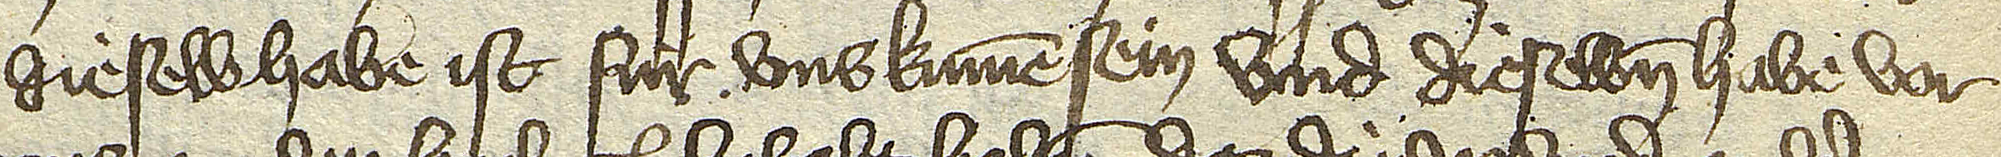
dieſelb habe iſt für vns kume* ſein vnd dieſelbn* habe vor
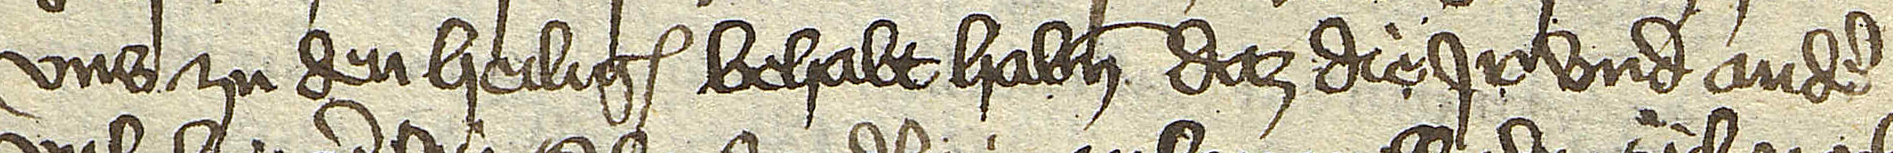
vns cʒu den heilig* behabt habn* daʒ die Ir vns ande*
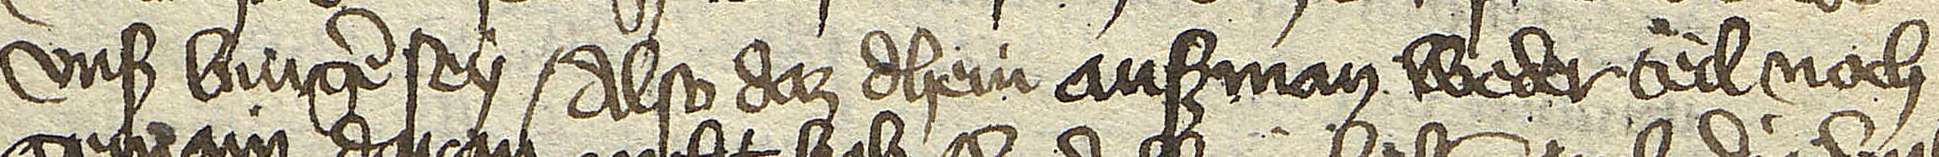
vnſ* burge* ſey / Alſo daʒ dhein auſʒman weder teil noch
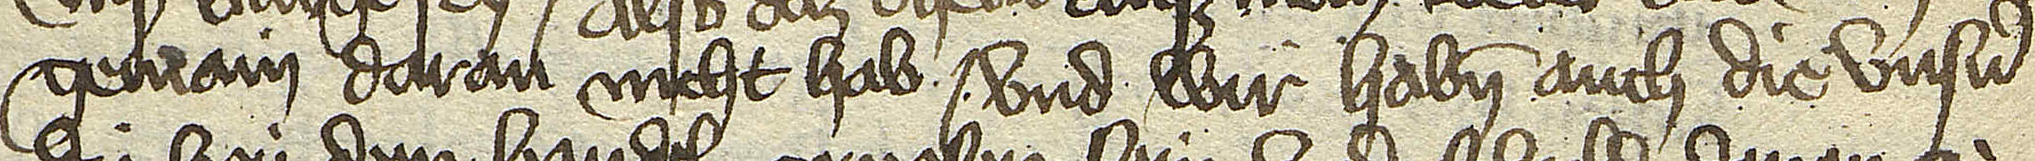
gemain daran nicht hab / vnd wir habn* auch die vnſn*
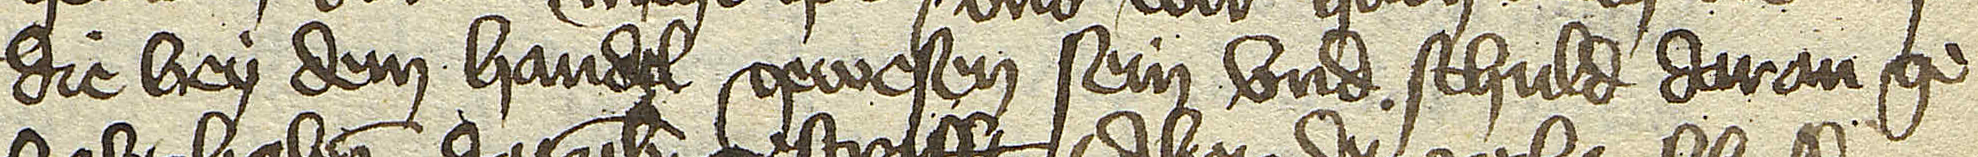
die bey dem handel geweſen ſein vnd ſchuld daran ge
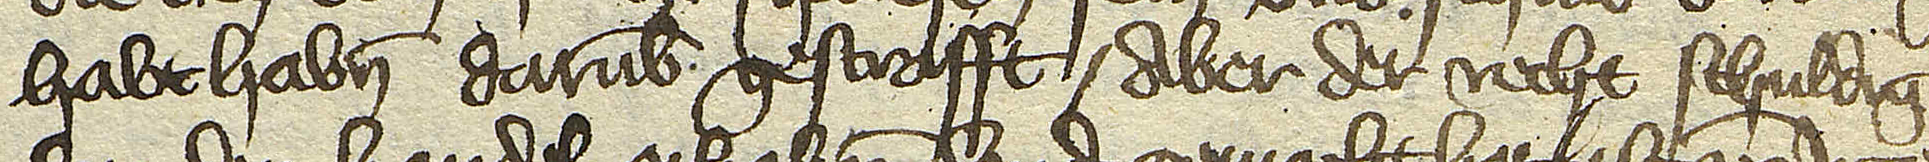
habt habn* darub* geſtrafft / Aber der recht ſchuldig
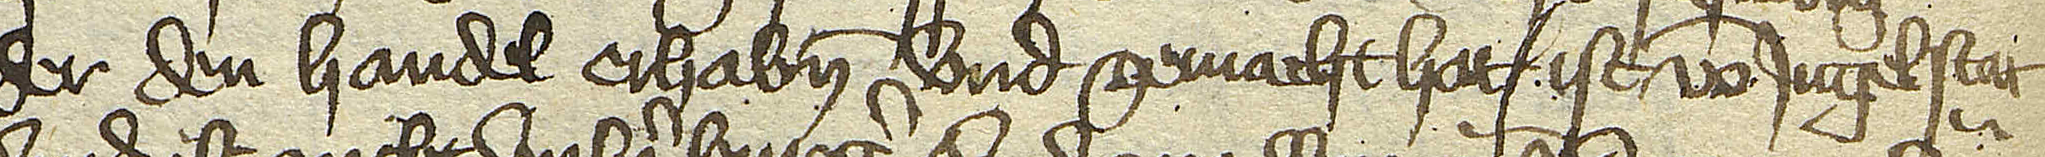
der den handel erhabn* vnd gemacht hat iſt vo* Ingelſtat
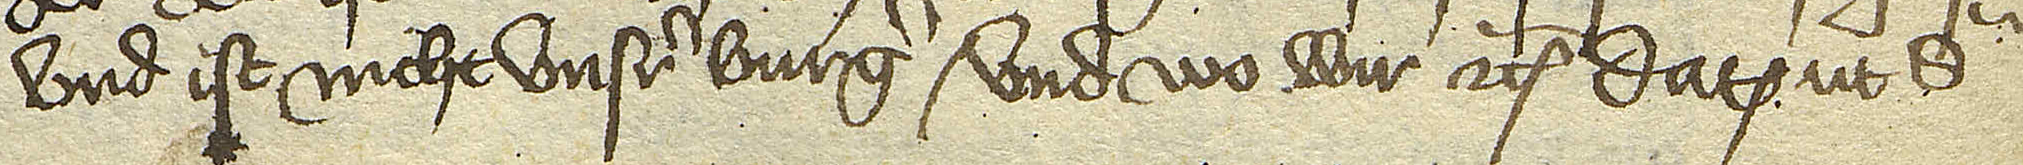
vnd iſt nicht vnſr* burg* / vnd wo wir ec* dat* ut S*
